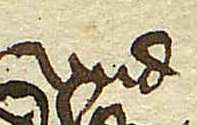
vnd
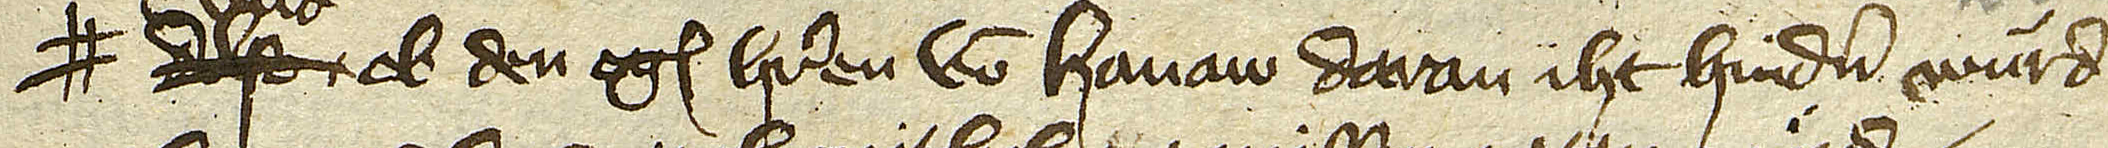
Alſo / ob den eg* hr*en vo* Hanaw daran iht hindn* würd
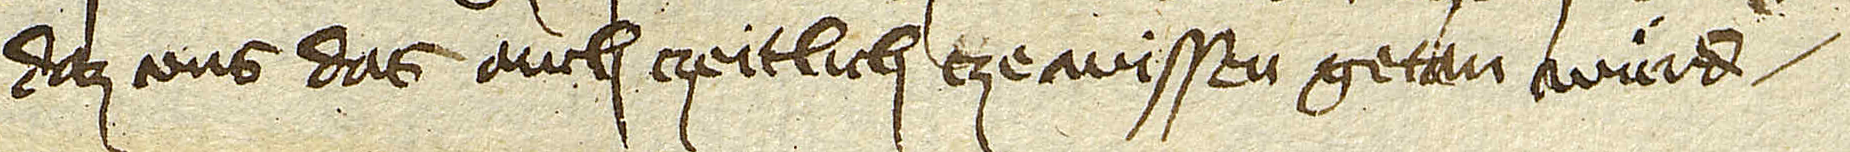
daʒ vns das auch cʒeitlich cʒewiſſen getan würd /
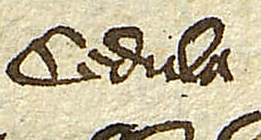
Cedula
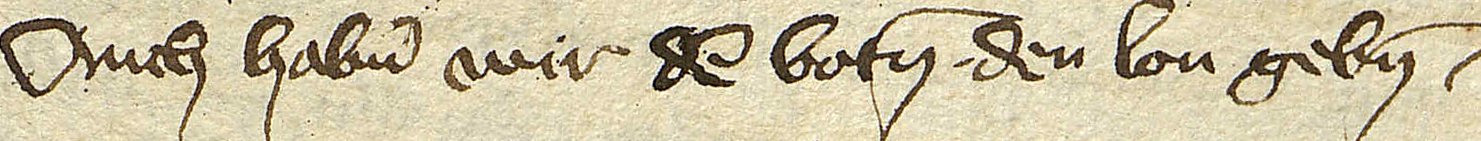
Auch habn* wir de* botn* den lon gebn* /
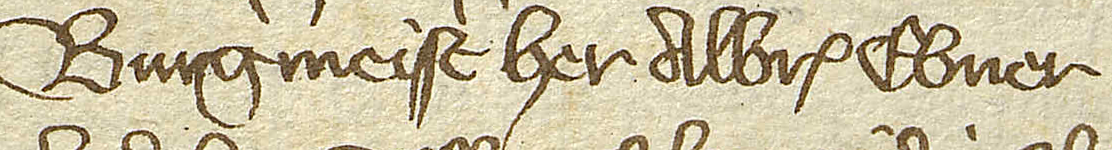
Burg*meiſt* her Albr* Ebner
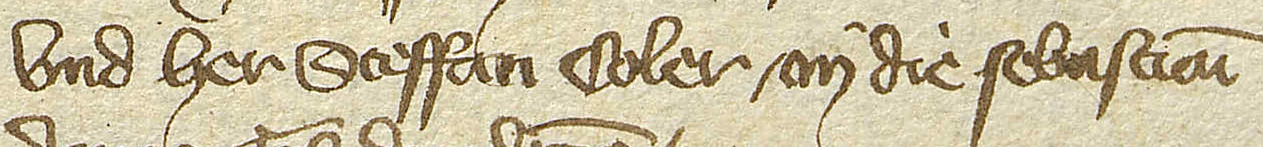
vnd her Steffan Coler / in die ſebaſtiai*
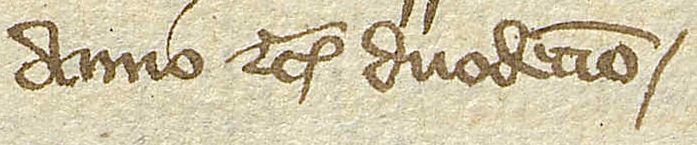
Anno ec* duodecio* /
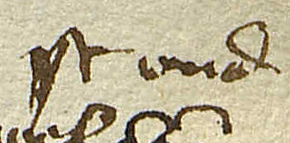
iſt vnd
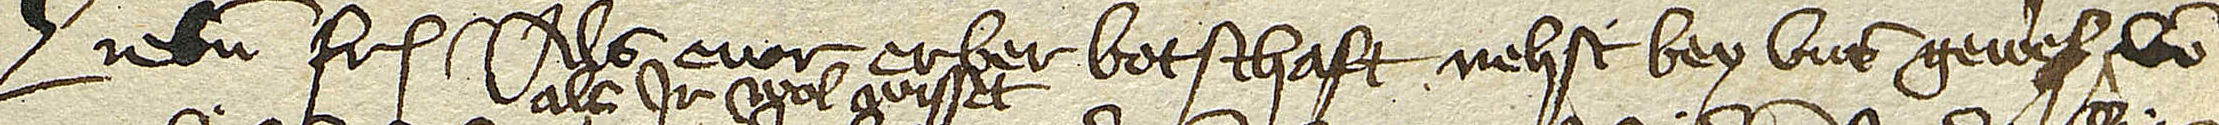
Liebn* fr* / Als ewr erber botſchaft nehſt bey vns geweſ* vo*
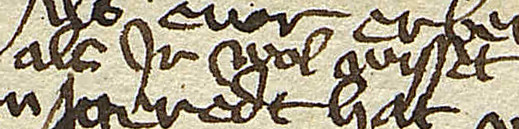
als Ir wol wiſſet
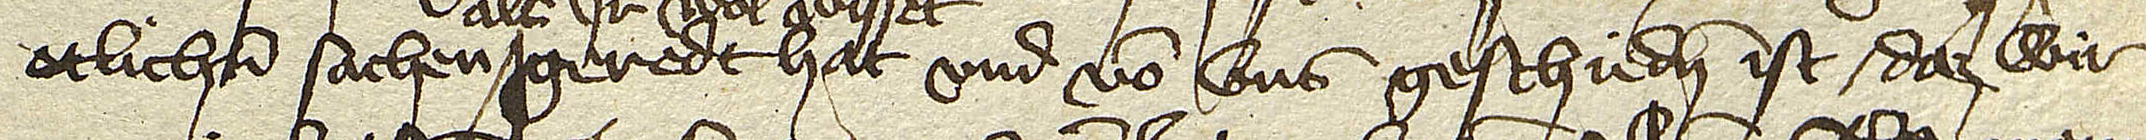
etlichn* ſachen geredt hat vnd vo* vns geſchiedn* iſt / daʒ wir
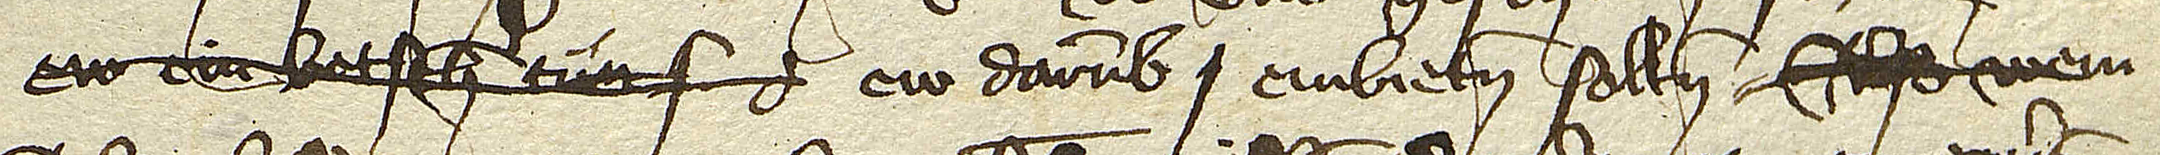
ew ein botſch* tün ſ d ew darub* / embietn* ſoltn* Alſo wem
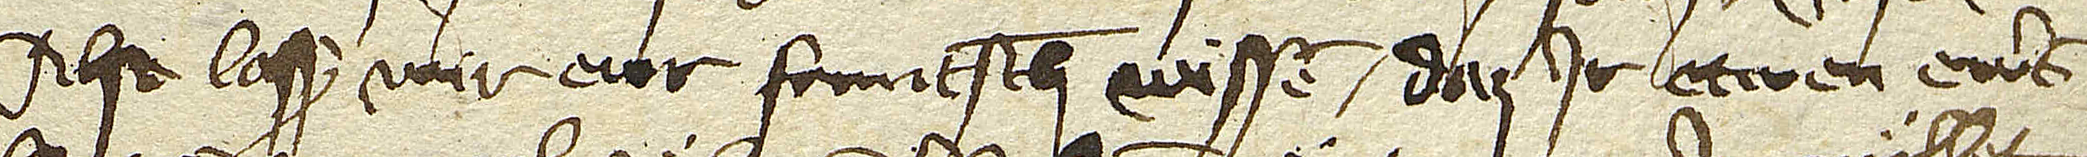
Alſo laſſ* wir ewr freuntſch* wiſſe* / daʒ Ir etwen ew*s
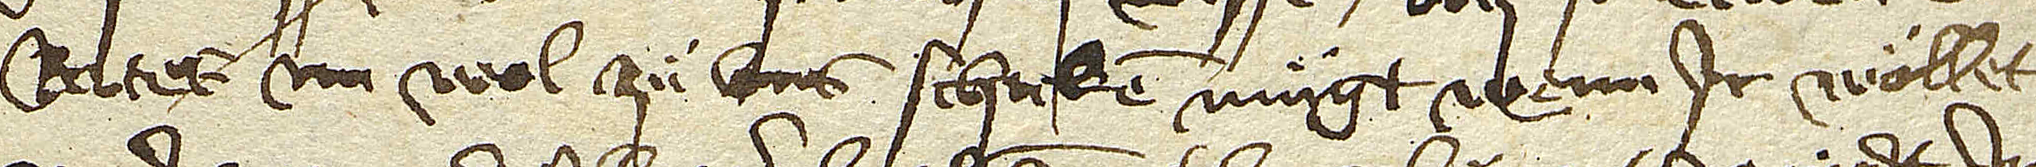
Rates nu wol cʒü vns ſchicke* mügt wenn Ir wöllet
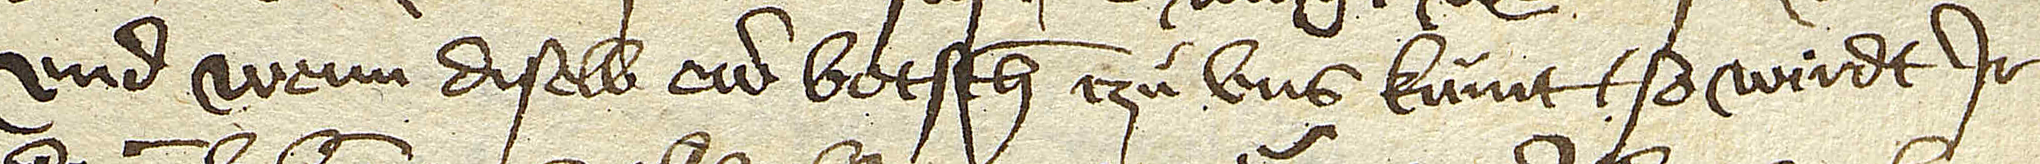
vnd wenn diſelb ew* botſch* cʒü vns kümt / ſo wirdt Ir
